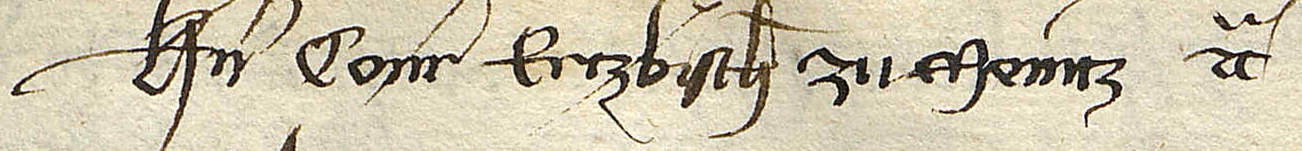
Hn* Conr* Ercʒbiſch* cʒu Meincʒ ec*
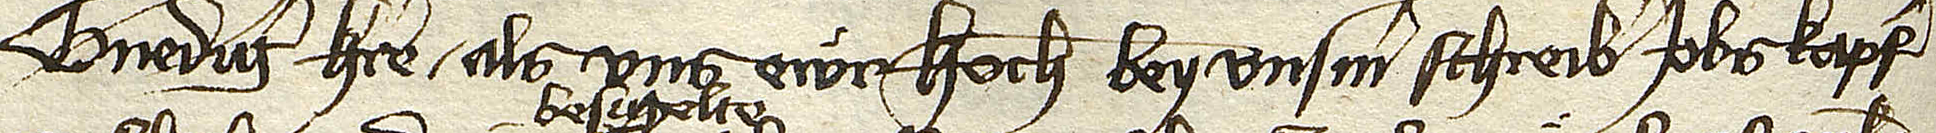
Gnedig* hre* / als vns eẅr hoch* bey vnſm* ſchreib* Iobs kapf*
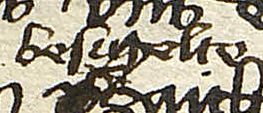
beſigelte
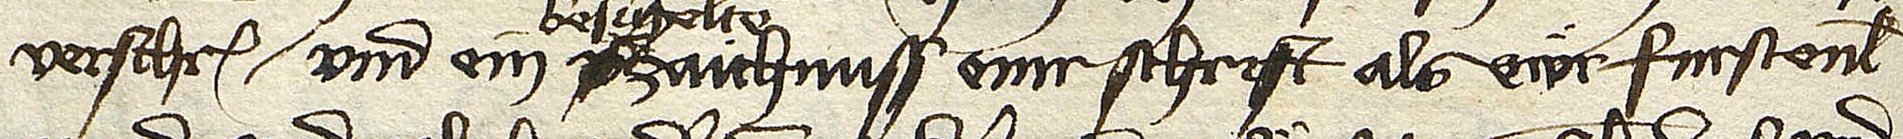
verſchr* vnd ein v*ʒaichnuſſ einr ſchrift als eẅr furſtenl*
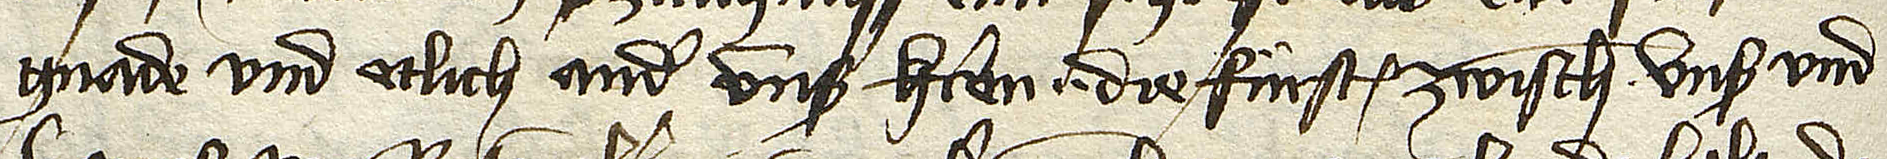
gnade vnd etlich and* vnſ* hren* ~ die fürſt* ʒwiſch* . vnſ* vnd
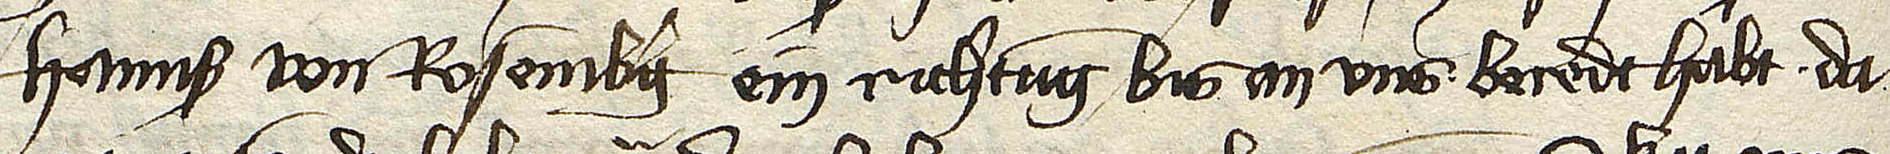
hannſ* von Roſembg* ein richtug* bis an vns . beredt habt . da
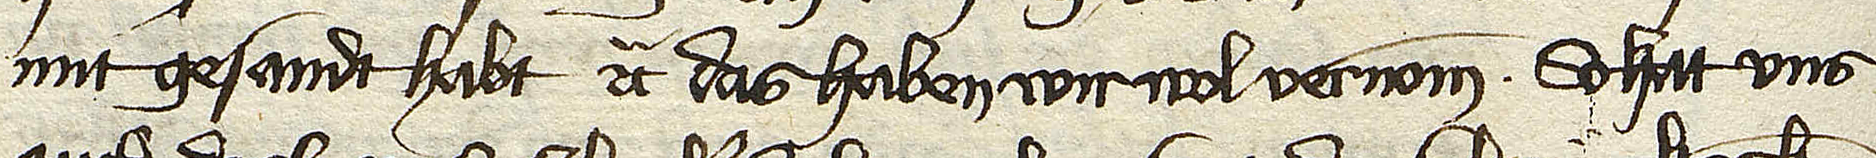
mit geſandt habt ec* das haben wir wol vernom* . So hat vns
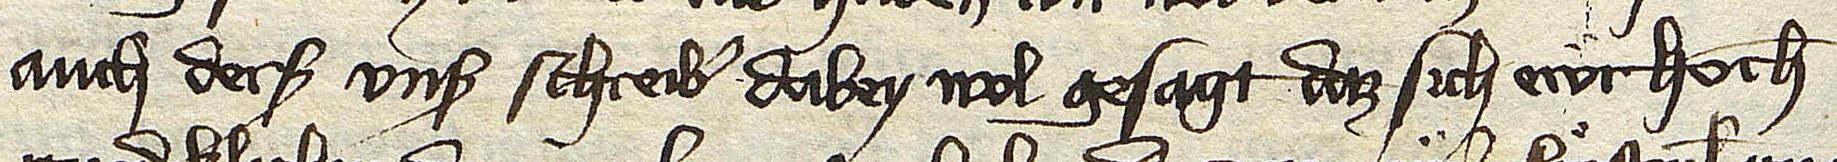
auch derſ* vnſ* ſchreib* dabey wol geſagt daʒ ſich eẅr hoch*
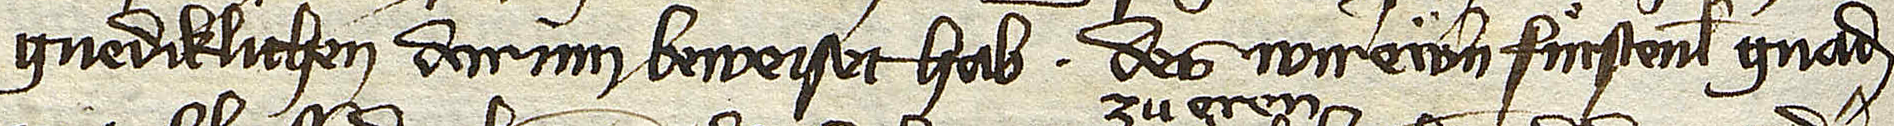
gnediklichen darinn beweiſet hab . des wir eẅn* fürſtenl* gnad*
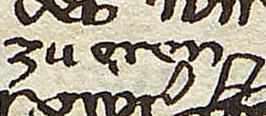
ʒu eren
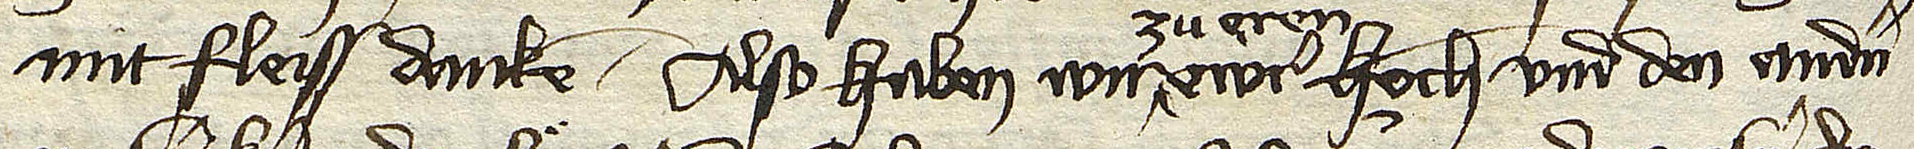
mit fleiſſ danke* / Alſo haben wir eẅr* hoch* vnd den andn*
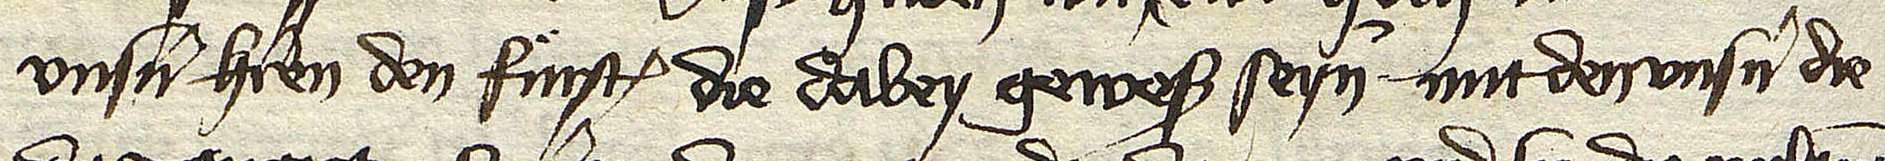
vnſn* hren* den fürſt* die dabey geweſ* ſeyn . mit den vnſn* die
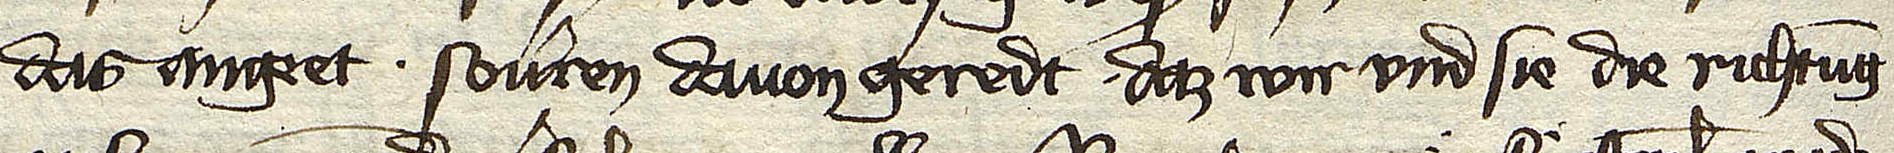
das angeet . ſouren* dauon geredt . daʒ wir vnd ſie die richtug*
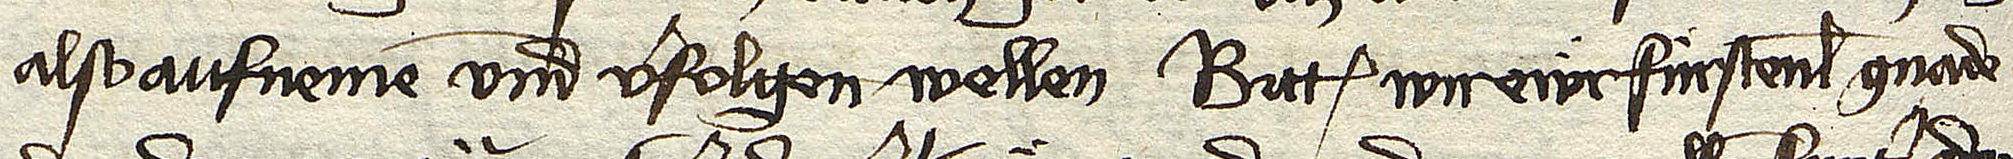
alſo aufneme* vnd vfolgen* wellen Bitt* wir eẅr fürſtenl* gnade
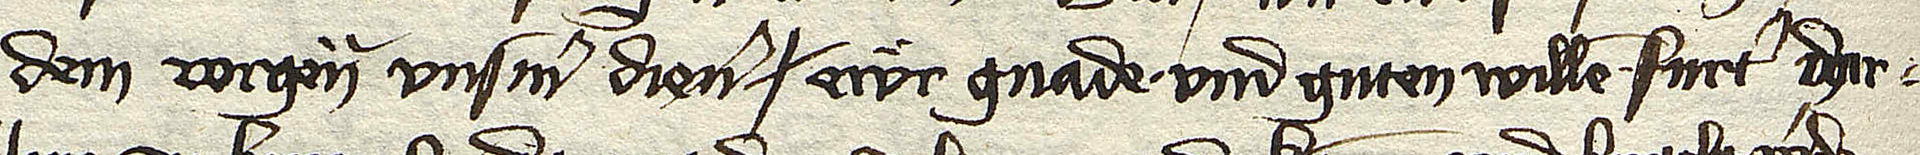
dem vorgen* vnſm* dien* eẅr gnade . vnd guten wille* furt* dar =
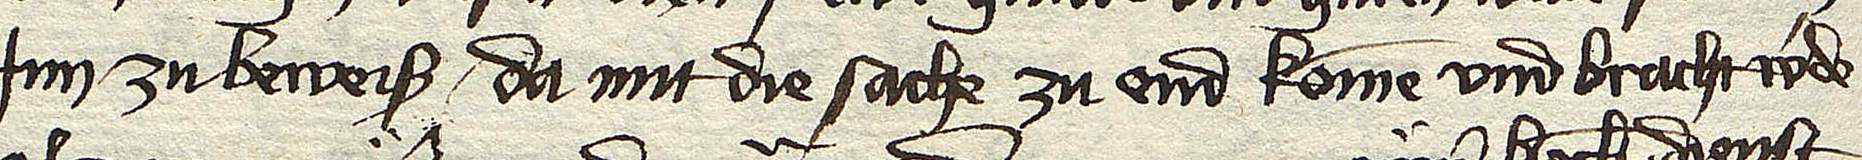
Inn ʒu beweiſ* / da mit die ſache ʒu end kome* vnd bracht wde*
